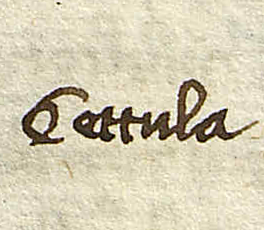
Cettula
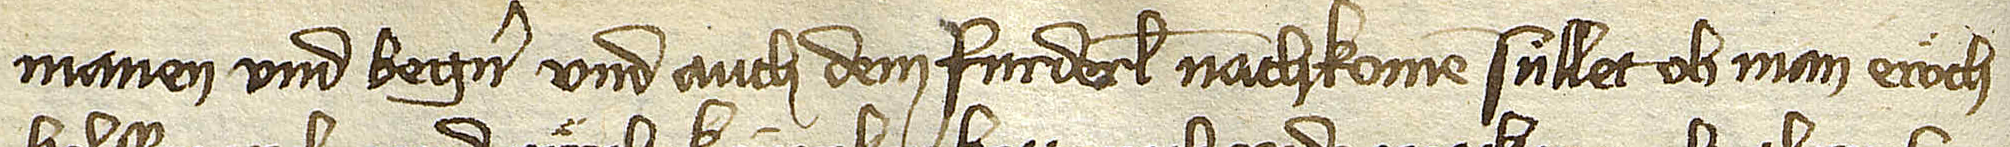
manen vnd beg*n vnd auch dem furderl* nachkome* ſüllet ob man ewch
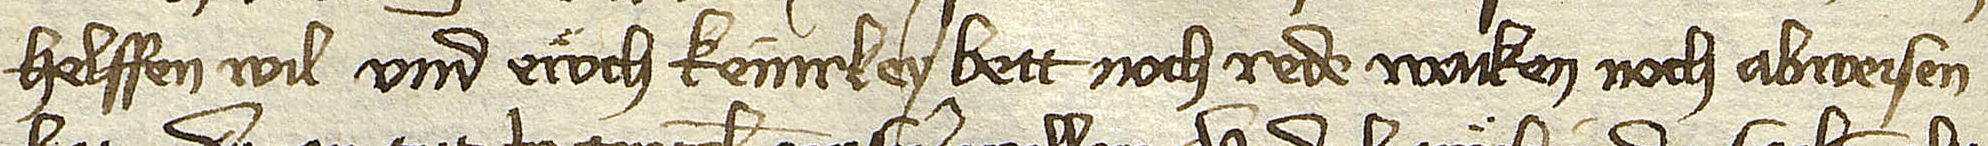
helffen wil vnd ewch keinrley bett noch rede waiken noch abweiſen
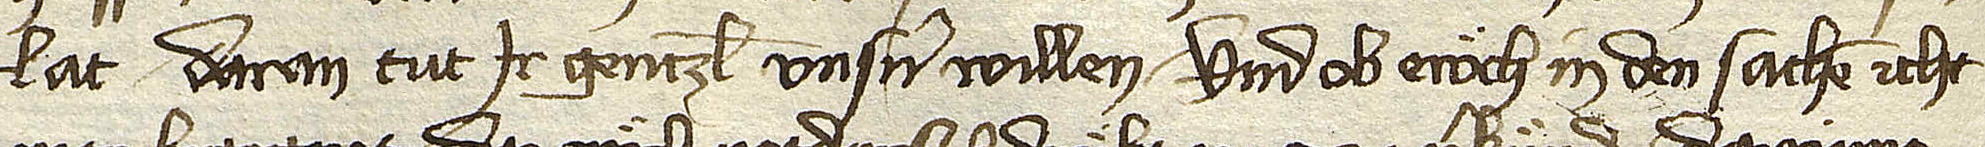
lat / Daran tut Ir gencʒl* vnſ*n willen / Vnd ob ewch in den ſache* icht
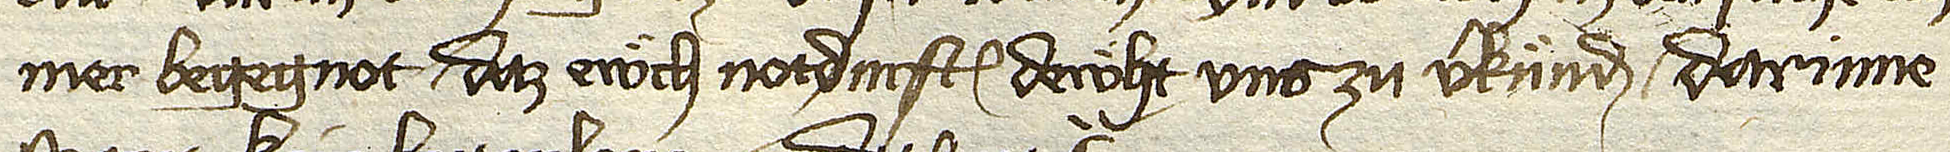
mer begegnot / daʒ ewch notdurft* dewcht vns ʒu v*künd* / darinne
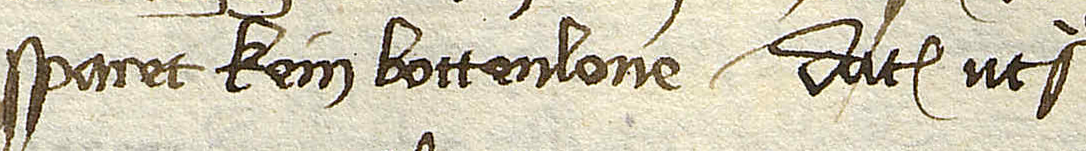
ſparet kein bottenlone / Dat* ut ſ*
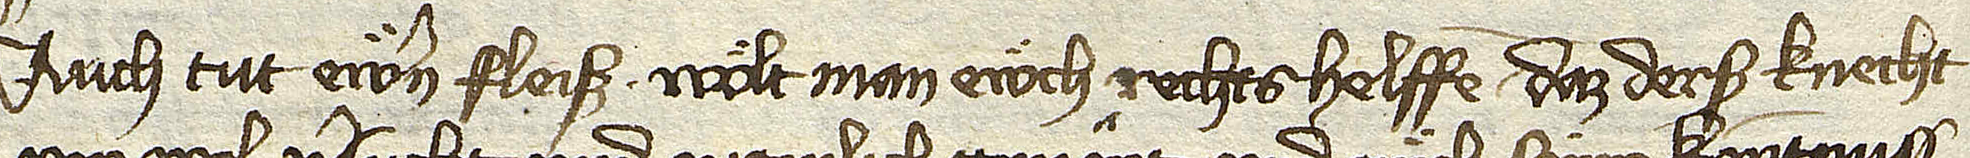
Auch tut ew*n fleiſʒ . wölt man ewch rechts helffe* / daʒ derſ* knecht
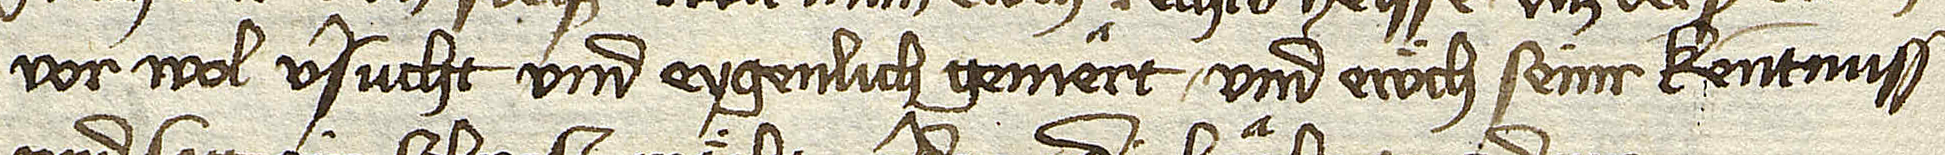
vor wol v*ſucht vnd eygenlich gemërt / vnd ewch ſeinr ken*tnuſſ
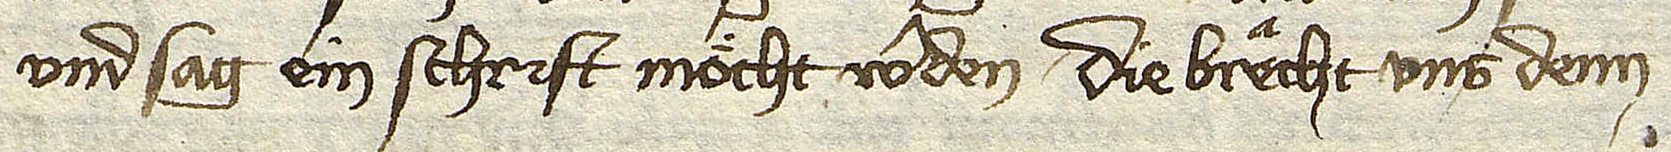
vnd ſag ein ſchrift möcht w*den / die brëcht vns denn
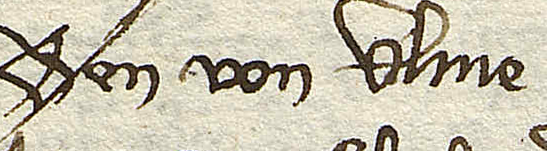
Den von Vlme
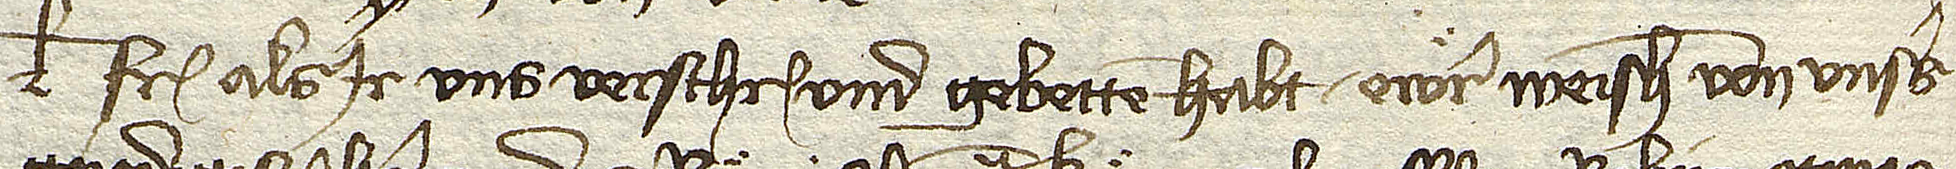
L* fr* als Ir vns verſchr* vnd gebette* habt / ew*r weiſh* von vnſ*s
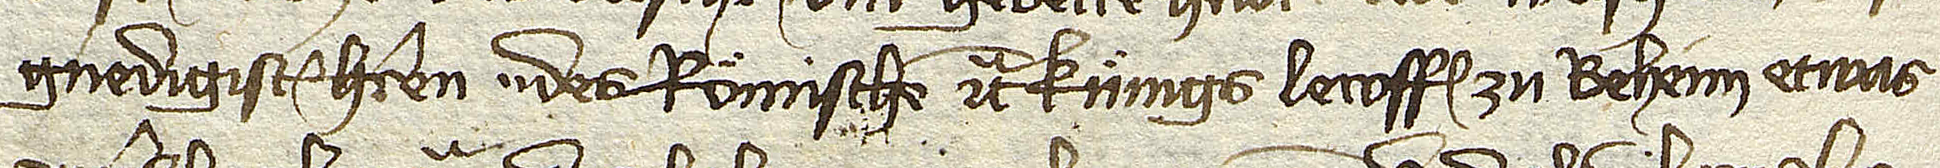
gnedigiſt* h*ren ~ des Römiſche* ec* künigs lewff ʒu Beheim etwas
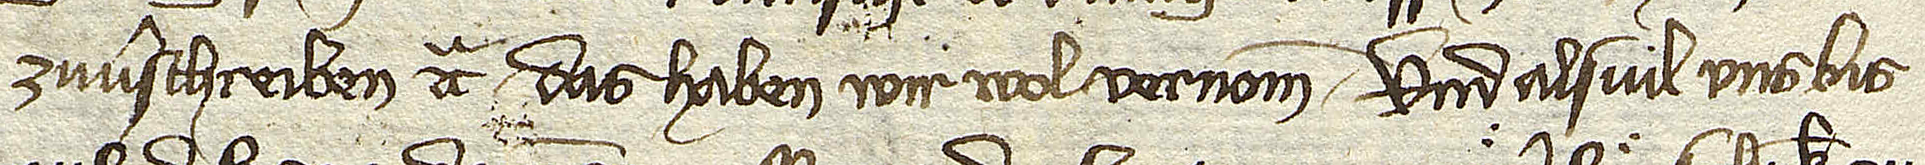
ʒuu*ſchreiben ec* / das haben wir wol vernom* / Vnd alſuil vns bis
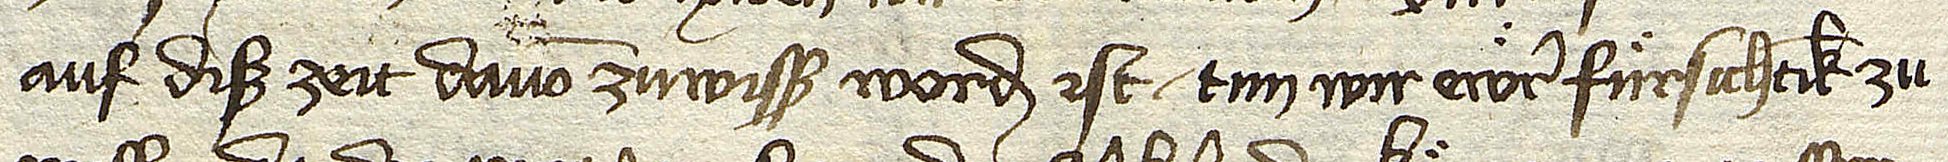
auf diſʒ ʒeit dauo* ʒuwiſſ* word* iſt / tun wir ew*r fürſichtik* ʒu
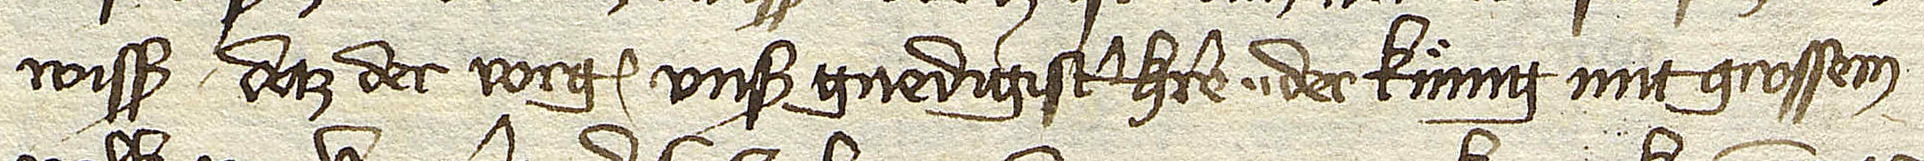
wiſſ* / daʒ der vorg* vnſ* gnedigiſt* ~ der künig mit groſſem
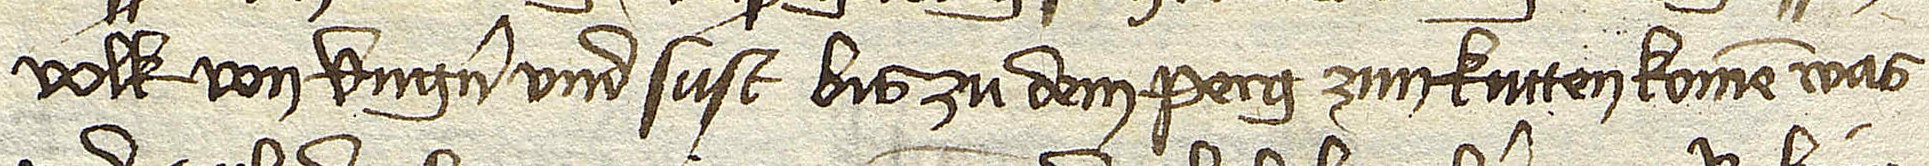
volk von Vng*n vnd ſuſt bis ʒu dem Perg ʒum kutten kome* was
